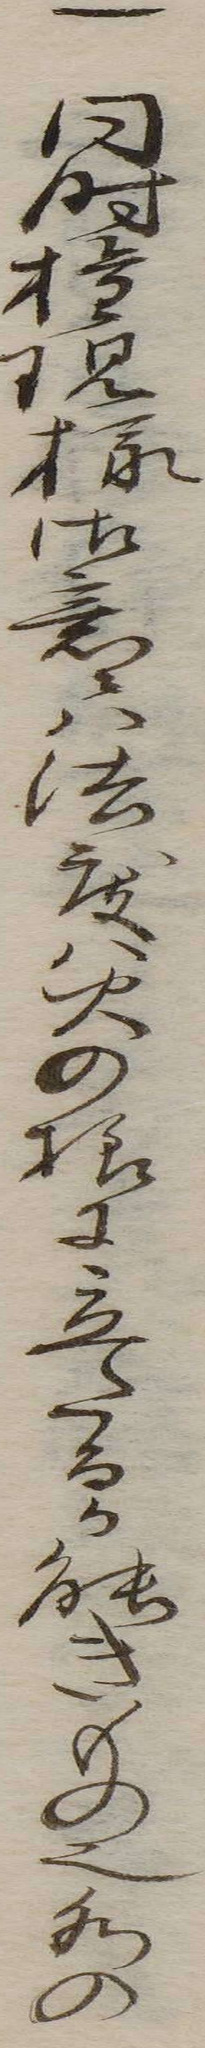一同時権現様御意ニは法度は火の様に立たるか能きもの也水の
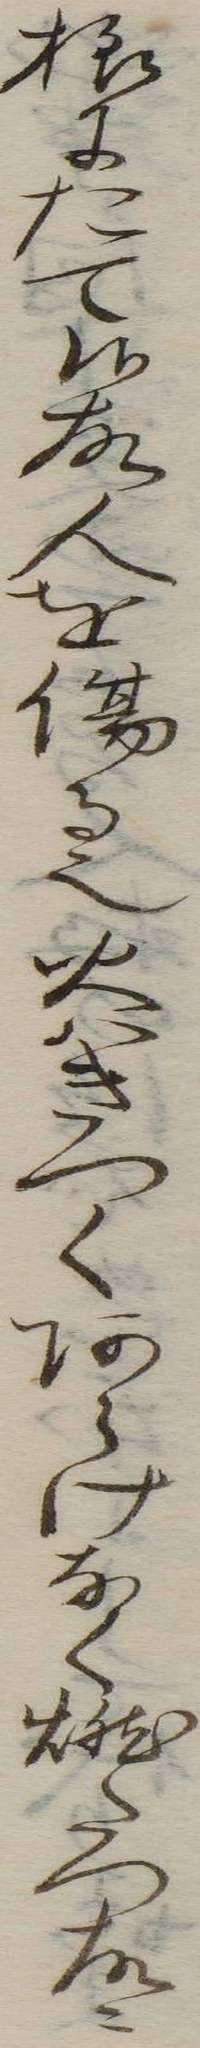様にたて候故人を傷る也火はきつくあらけなく燃たつ故ニ
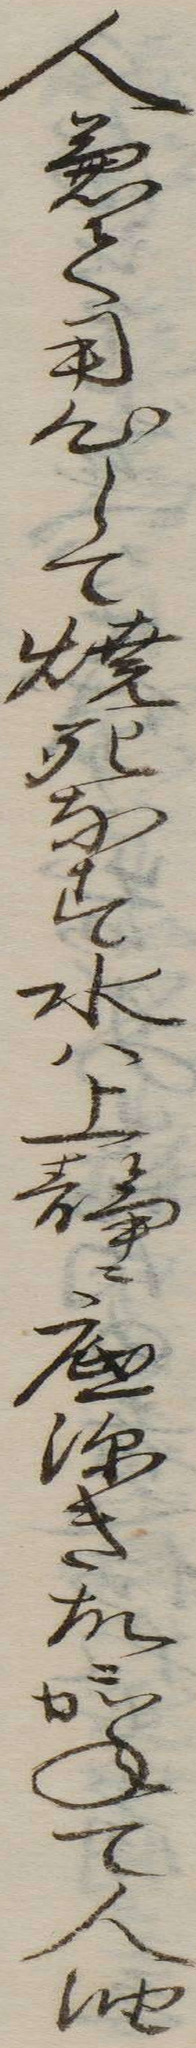人兼て用心して焼死なす水は上静ニ底深き故ニかねて人油
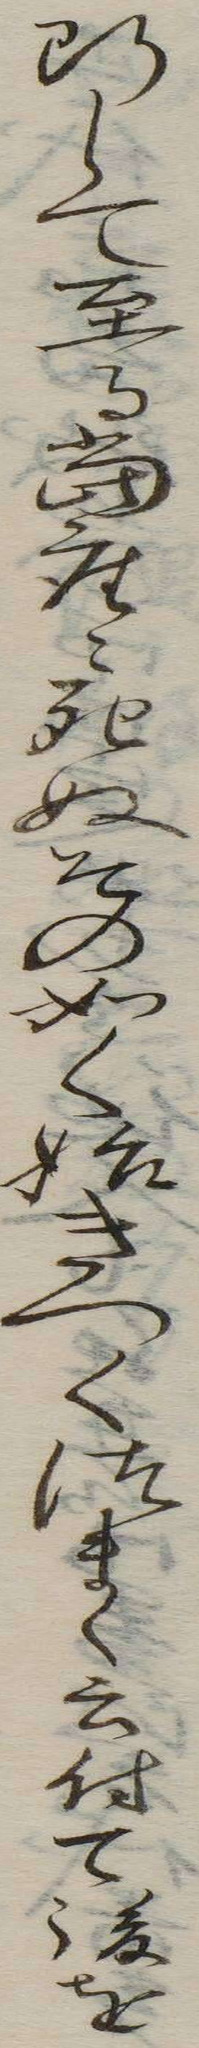断して到る当座ニ死ぬその如く始きつくつまく云付て後を
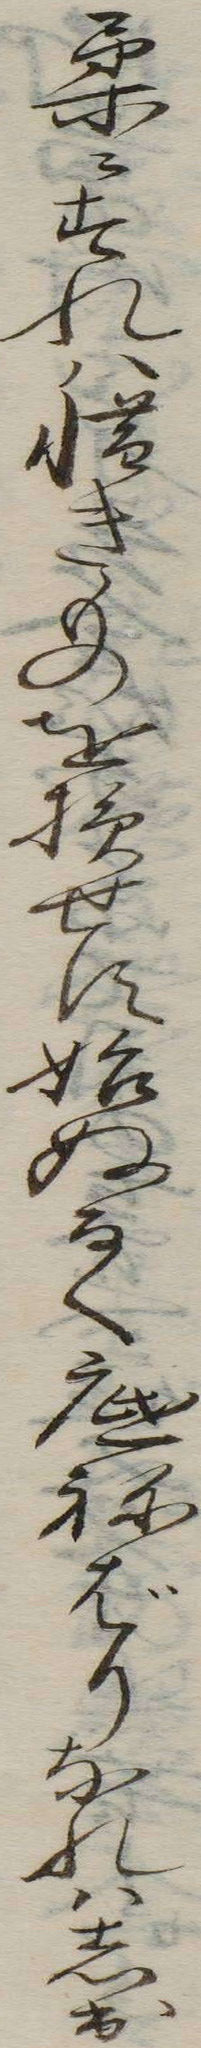柔ニすれは惜きものを損せす始ぬるく底ねばりなれはし出
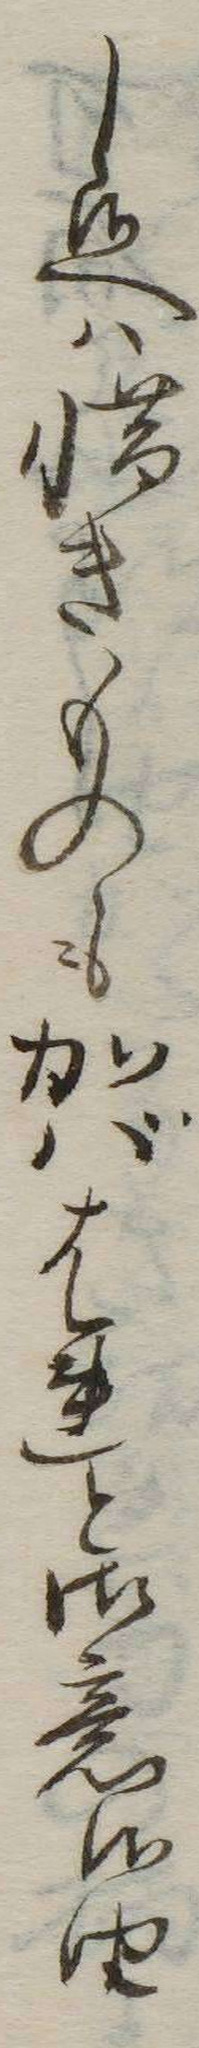し候へは惜きものもかばはれと御意候由
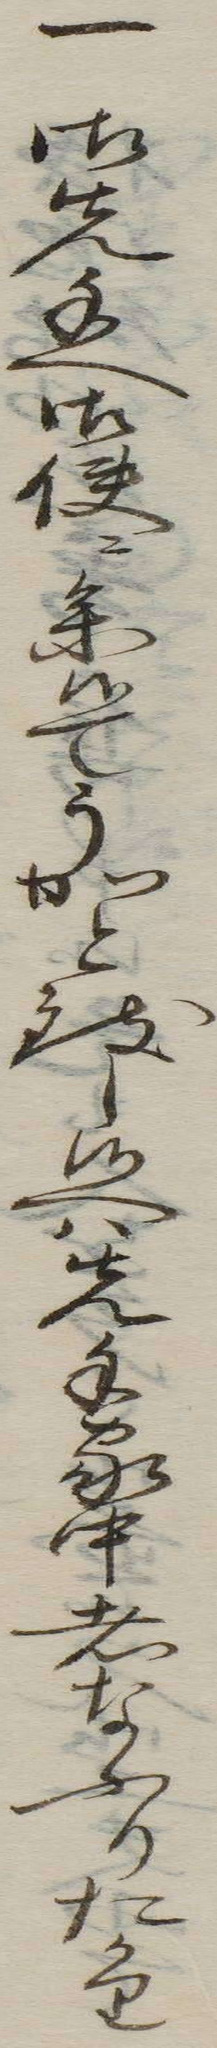一御先手へ御使ニ参候てうかと致し候へは先手家中者なふりたかり
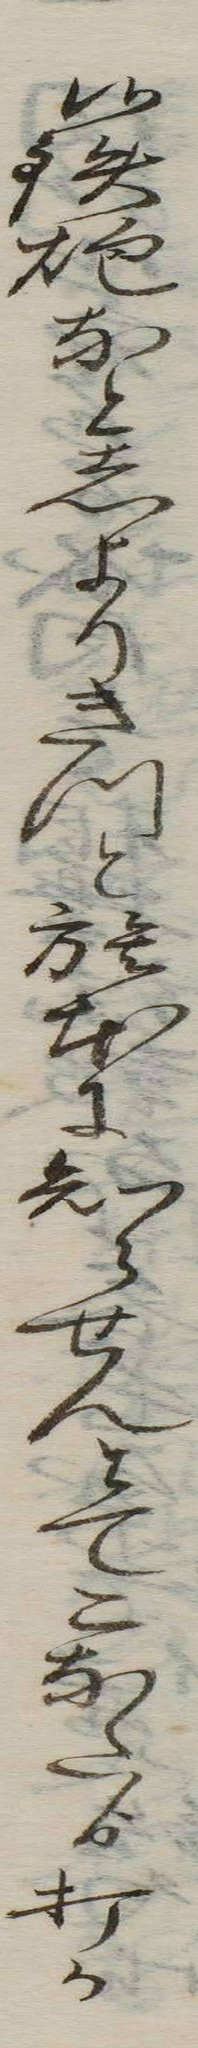御鉄炮なとしよりきつと旗本に知らせんとてこなたゟ打か
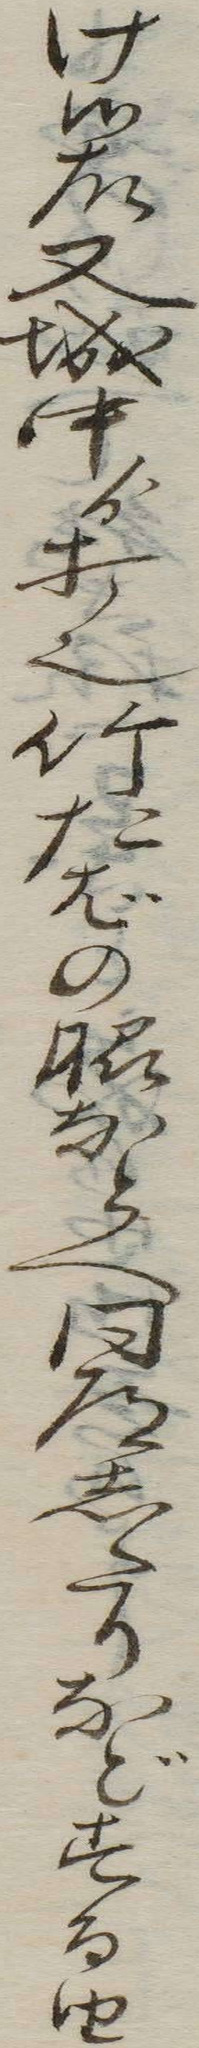け候故又城中ゟ打也竹たばの脇なとへ同道したりなどする由
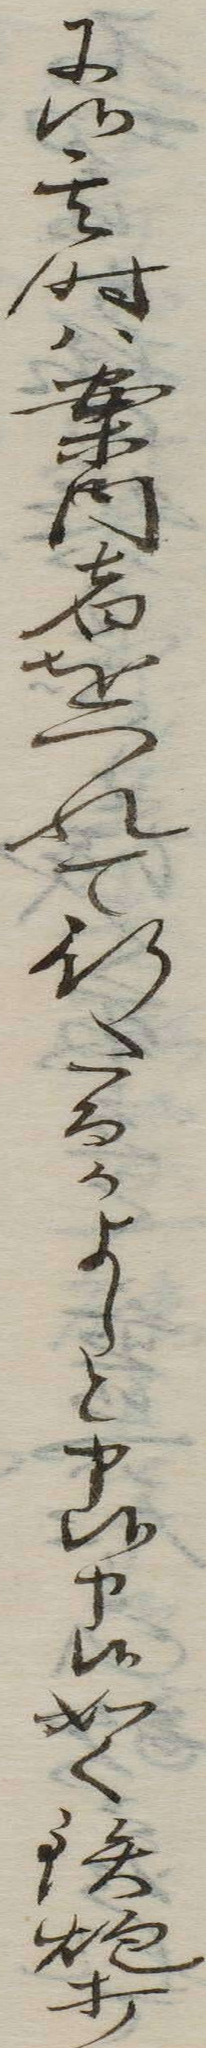に候其時は案内者をつれて行たるかよしと申候申候如く鉄炮打
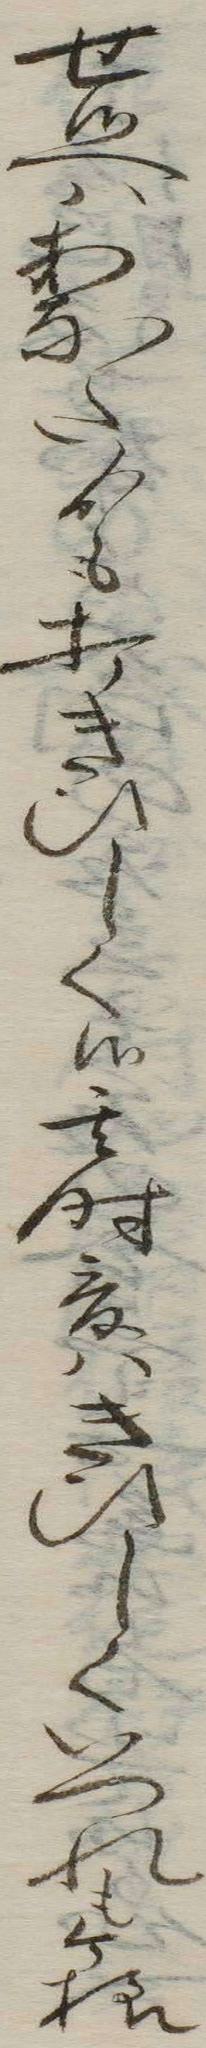せ候へはあなたゟも打きひしく候其時爰はきひしくいつれもケ様
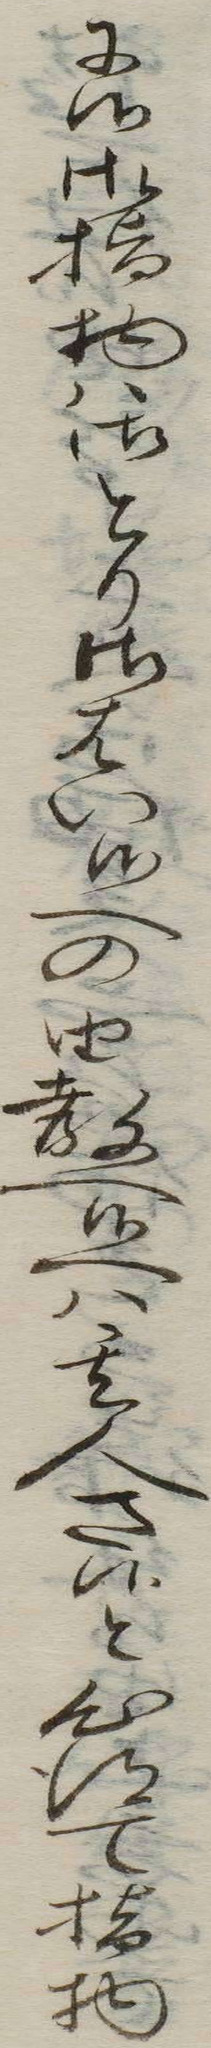に候御指物は御とり御はい候への由教へ候へは其人さ候と心得て指物
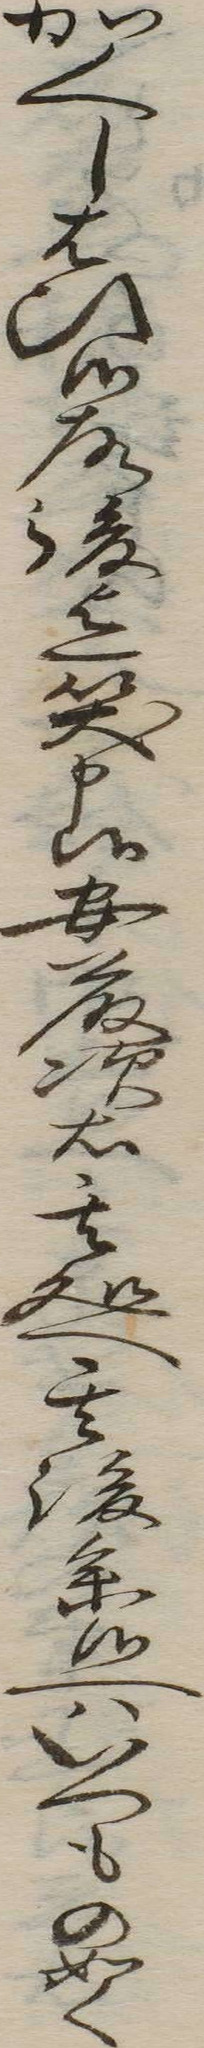かくしはひ候故後迄笑申候安藤次右其処へ其後参候へはいつもの如く
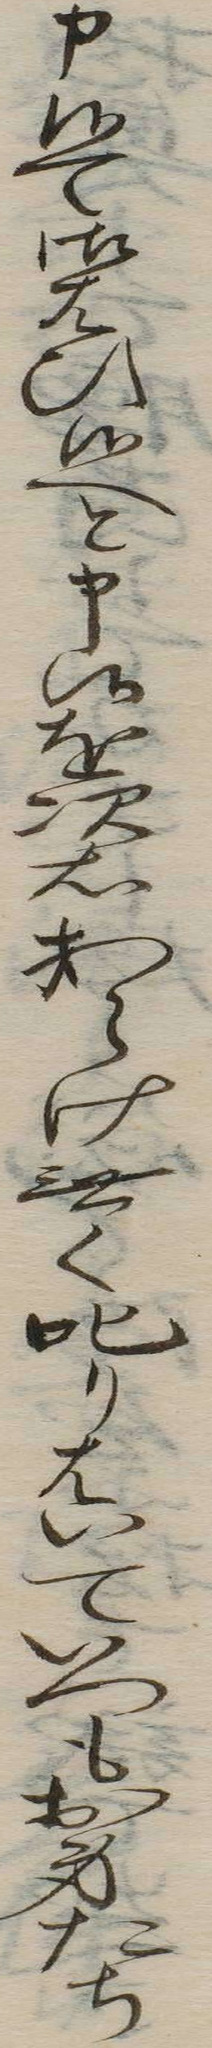申候て御はひ候へと申候を次右あらけ無く叱りはいていつもお身たち
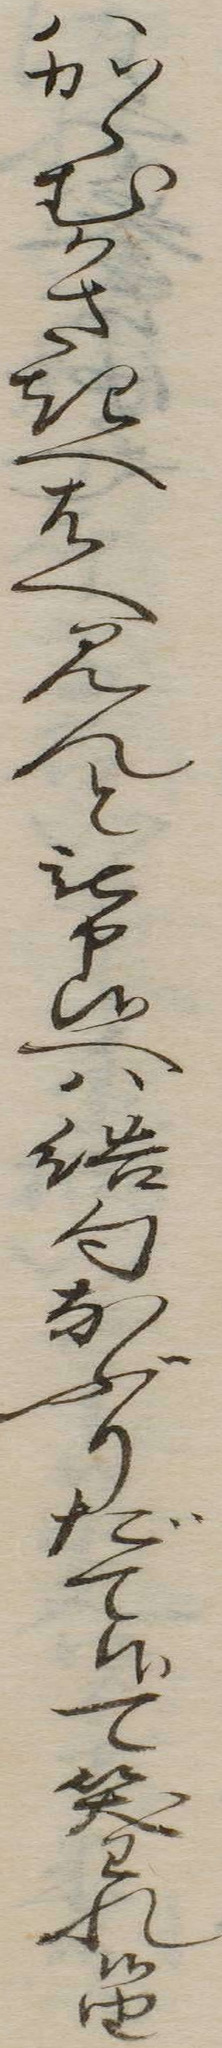はかゝむかさきへはへ見んと被申候へは結句なぶりだて候て笑われ候由
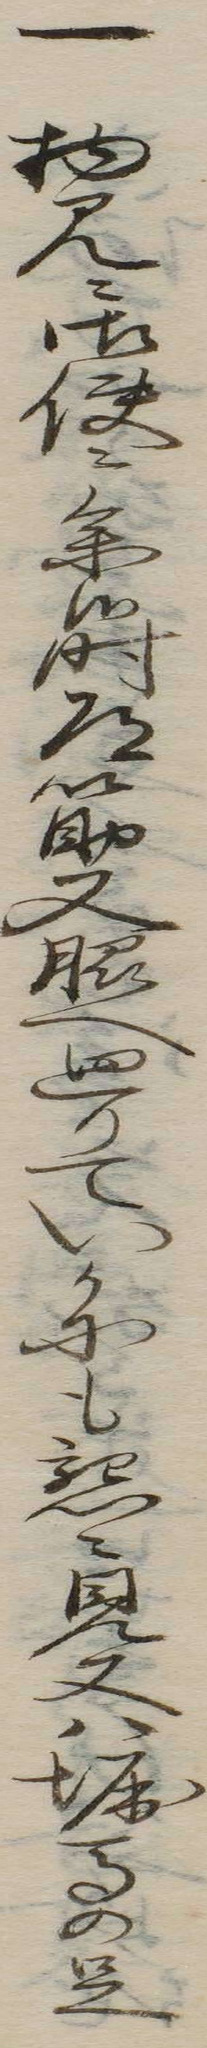一物見ニ御使ニ参候時道筋又脇へ廻りていかにも懇ニ見又は堀馬の足
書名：三河之物語
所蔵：国文学研究資料館
